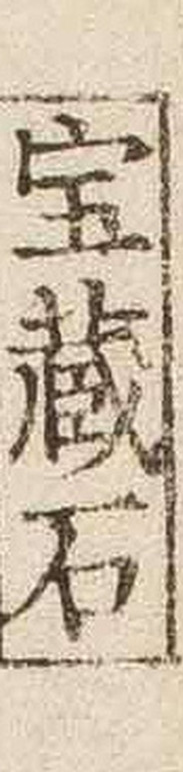宝蔵石
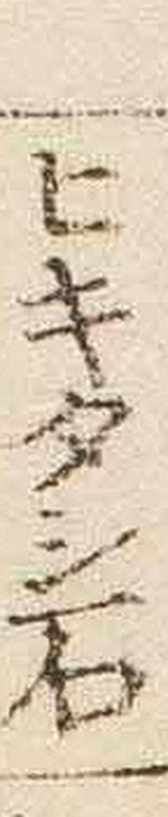ヒキタシ石
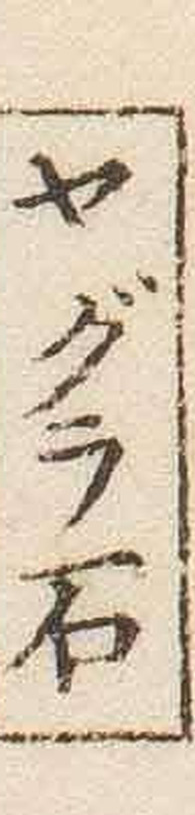ヤグラ石
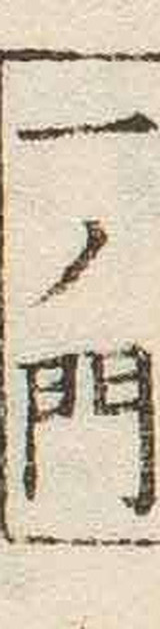一ノ門
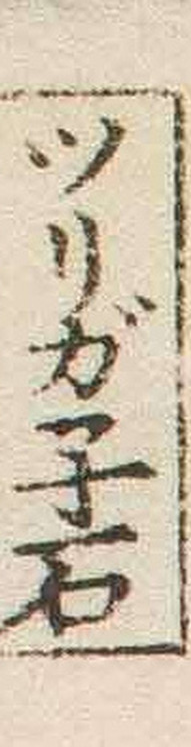ツリガネ石
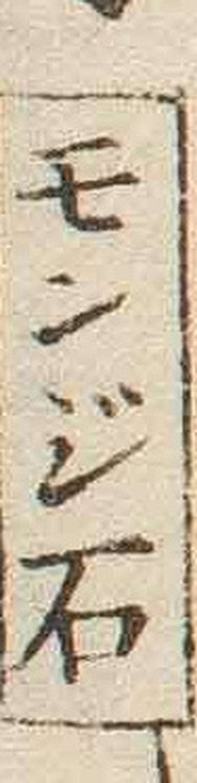モンジ石
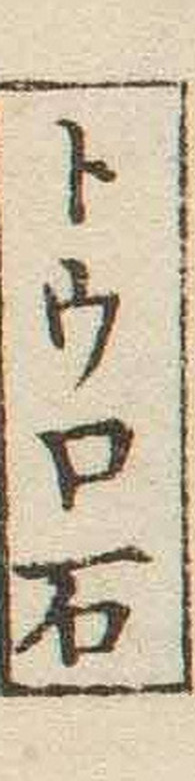トウロ石

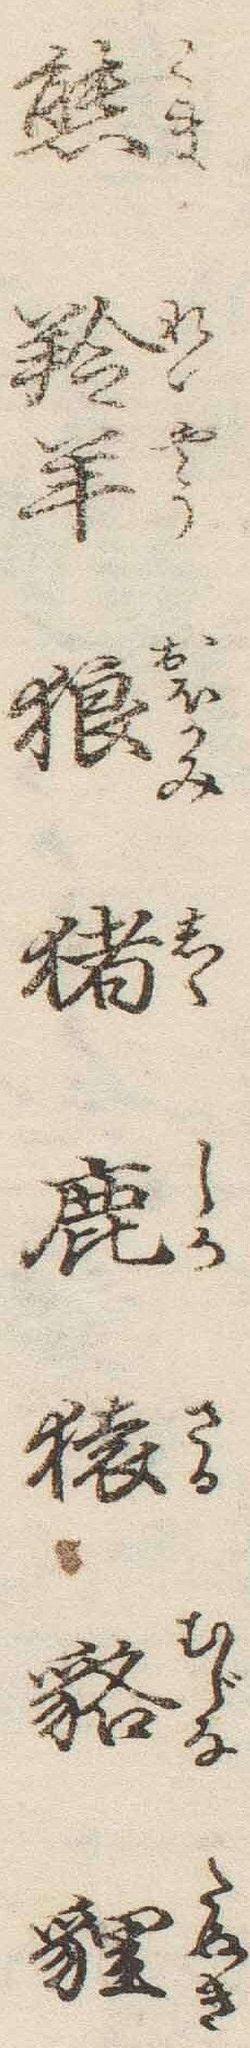熊羚羊狼猪鹿猿貉貍
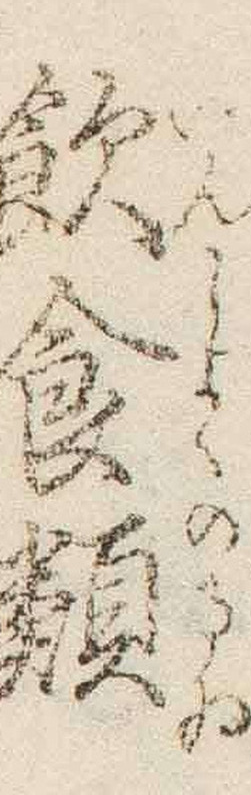飲食類
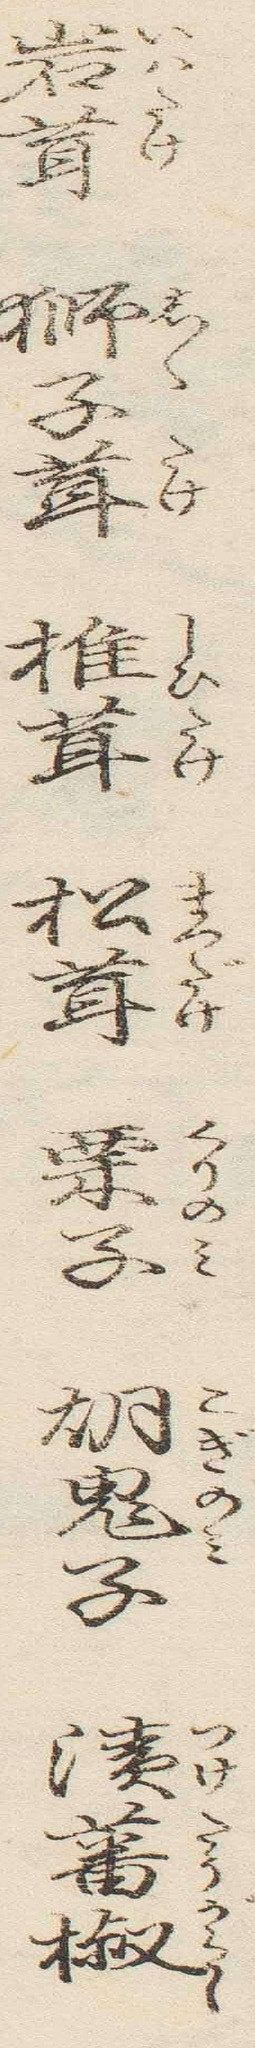岩茸獅子茸椎茸松茸栗子胡鬼子漬蕃椒
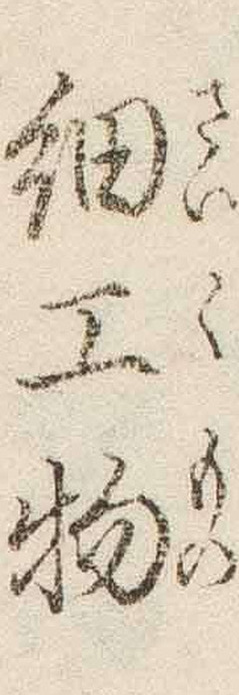細工物
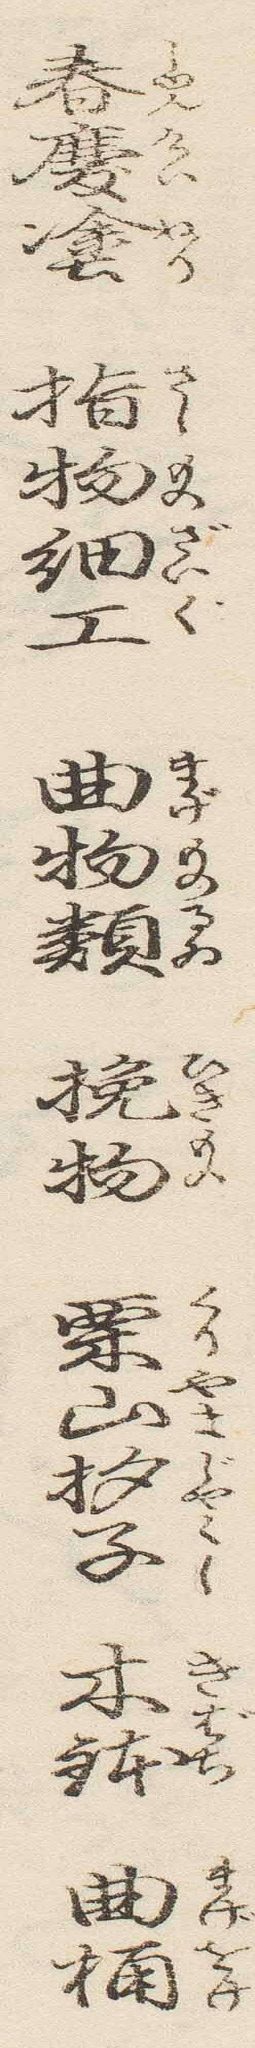春慶塗指物細工曲物類挽物栗山𪭜子木鉢曲桶

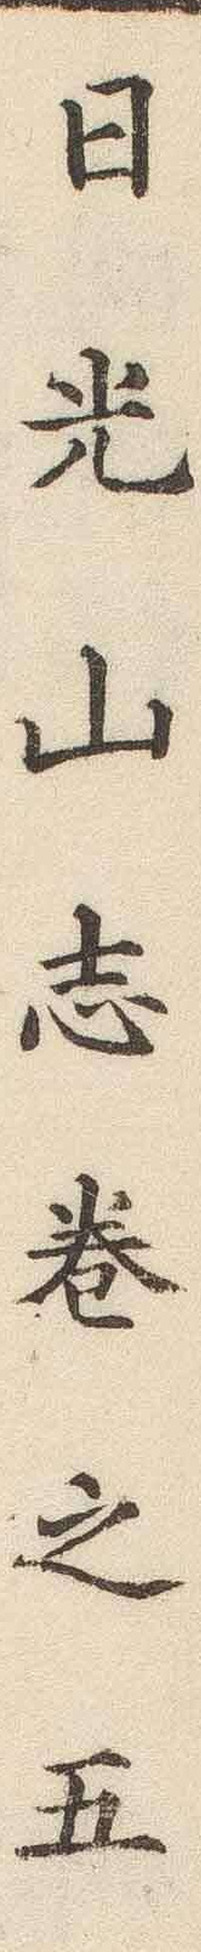日光山志巻之五

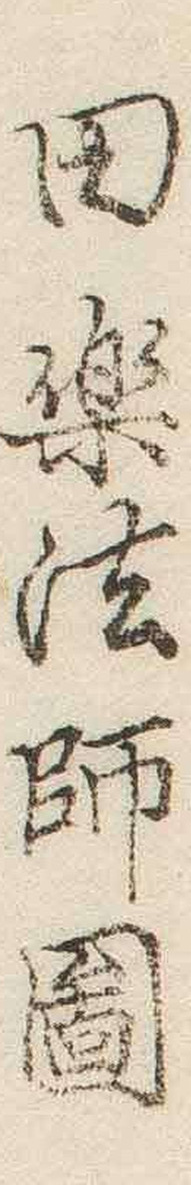田樂法師圖

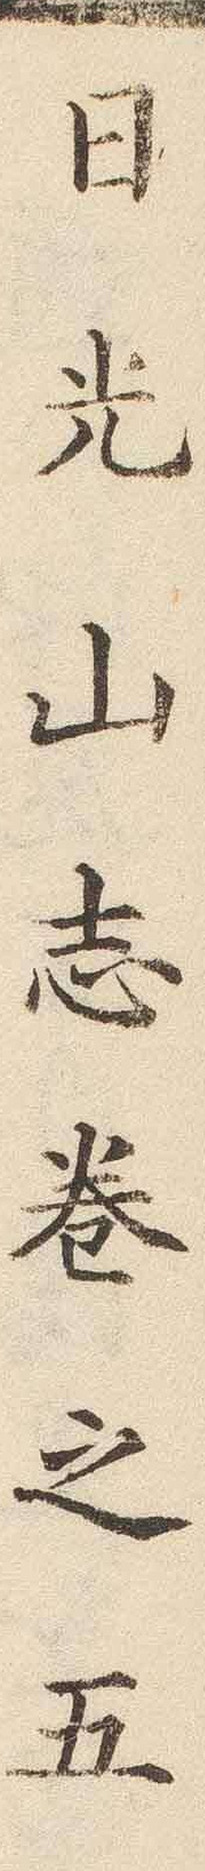日光山志巻之五
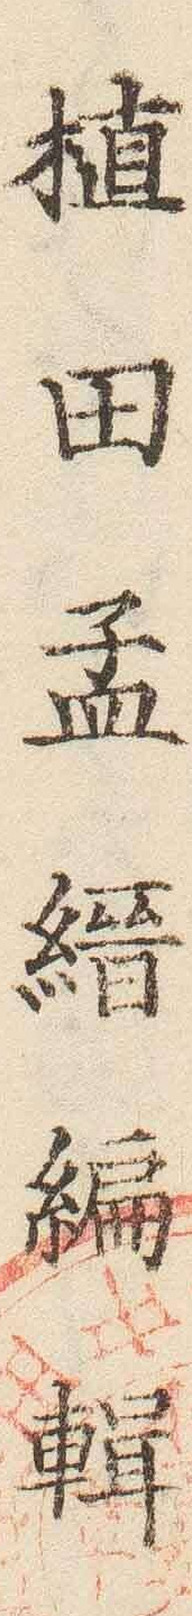植田孟縉編輯
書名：日光山志
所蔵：東京学芸大学附属図書館 国文学研究資料館
